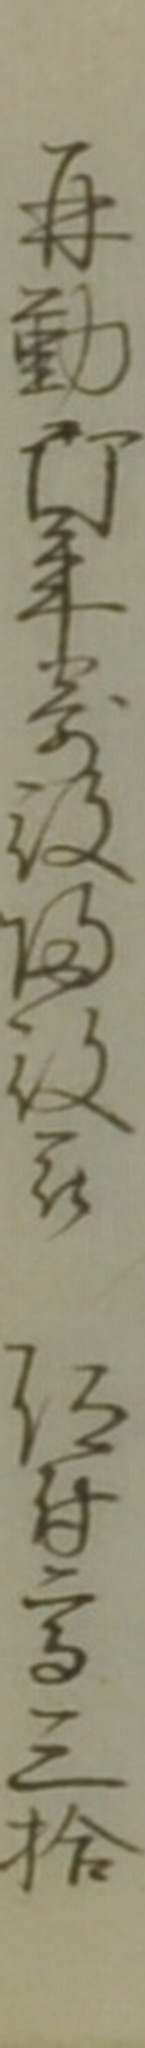再勤御年寄役帰役被仰付高三拾
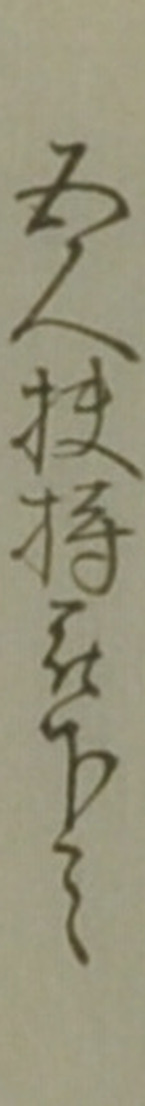五人扶持被下之
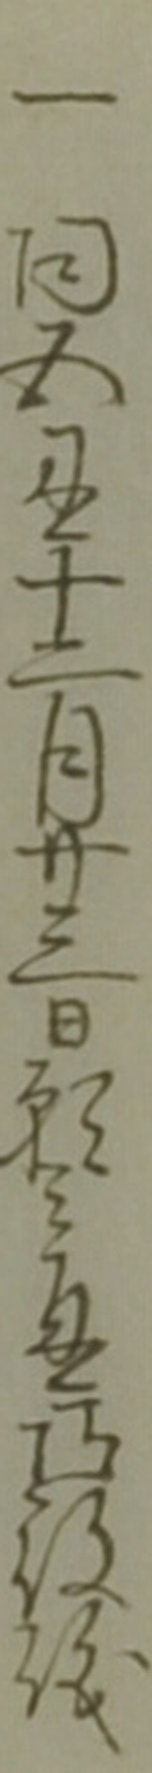一同五丑十二月廿三日願之通御役儀
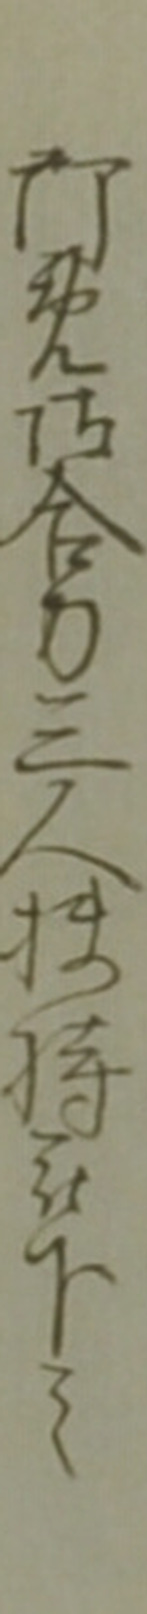御免御合力三人扶持被下之
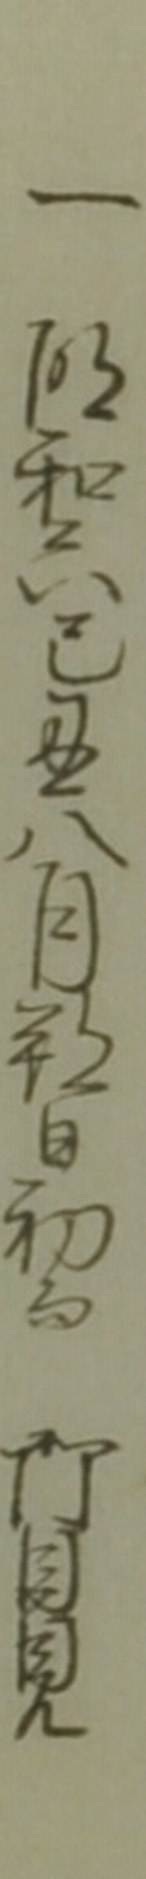一明和六己丑八月朔日初而御目見
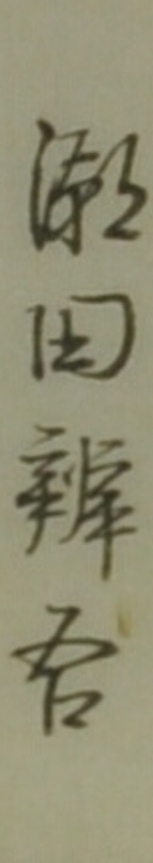潮田弁吾
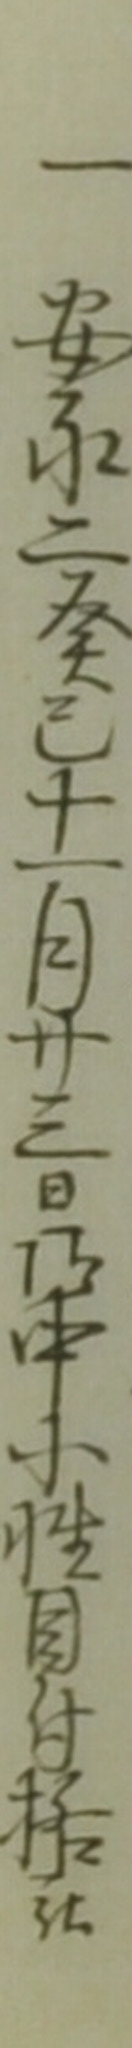一安永二癸巳十一月廿三日御中小性目付格被
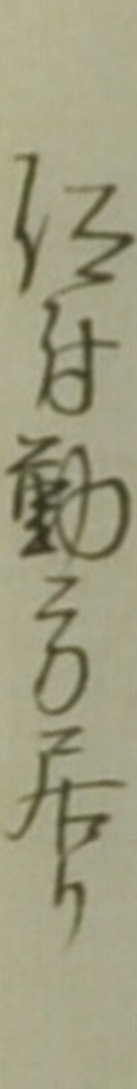仰付勤方居リ

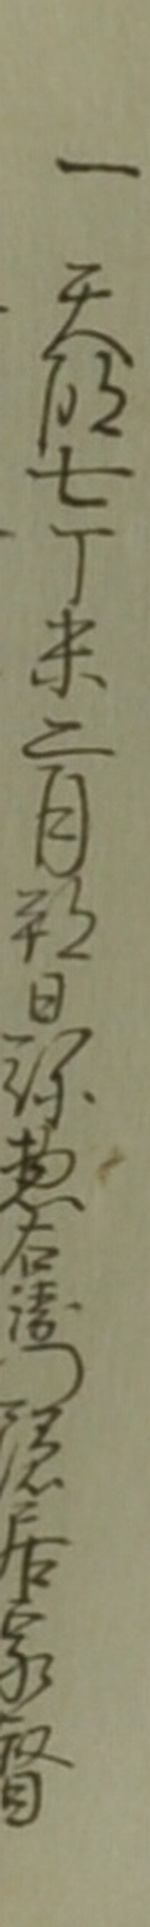一天明七丁未二月朔日弥惣右衛門隠居家督
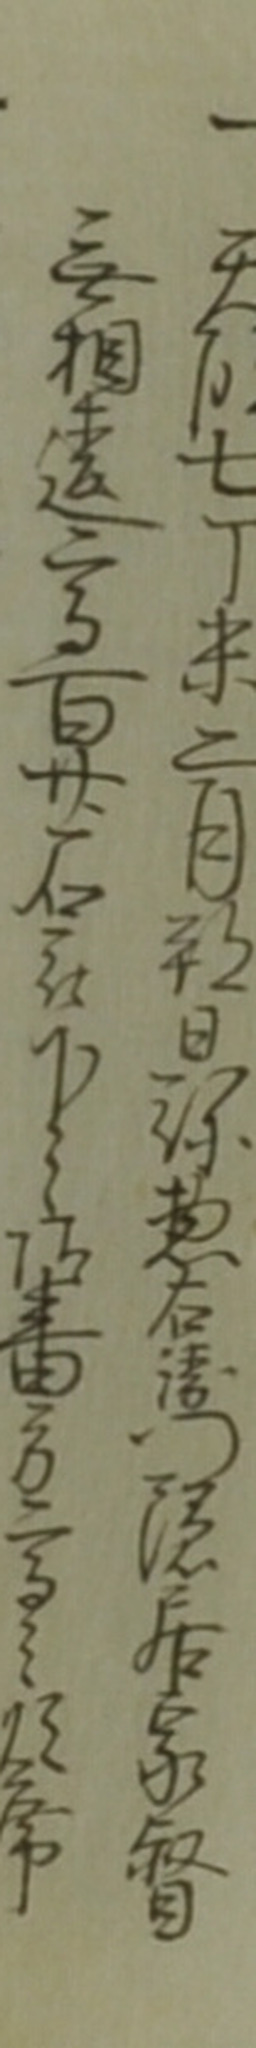無相違高百廿石被下之御番方高之順席
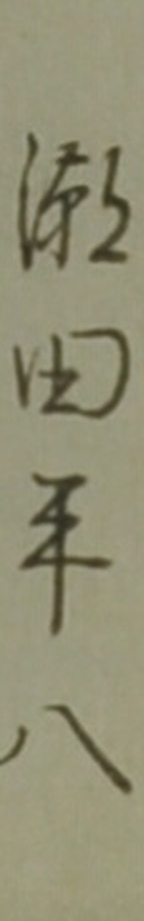潮田平八
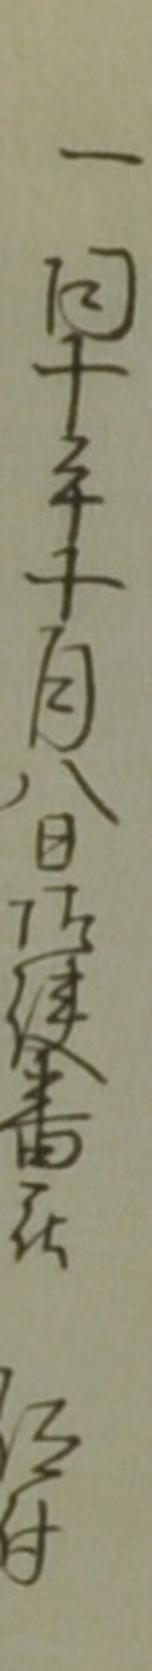一同十午十月八日御使番被仰付
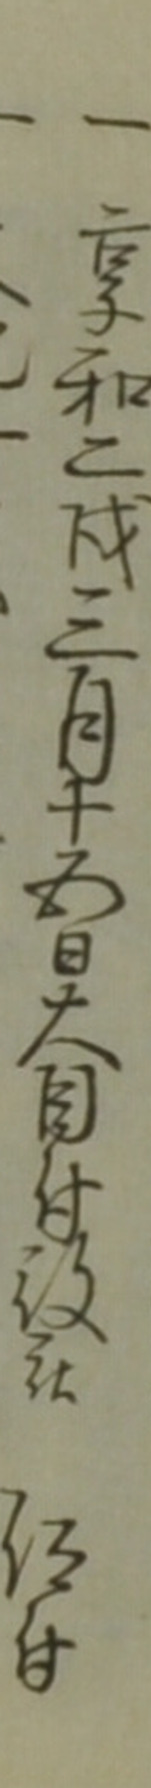一享和二戌三月十五日大目付役被仰付
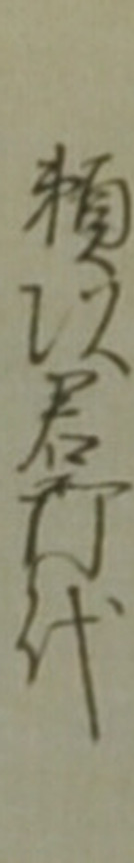頼以君御代
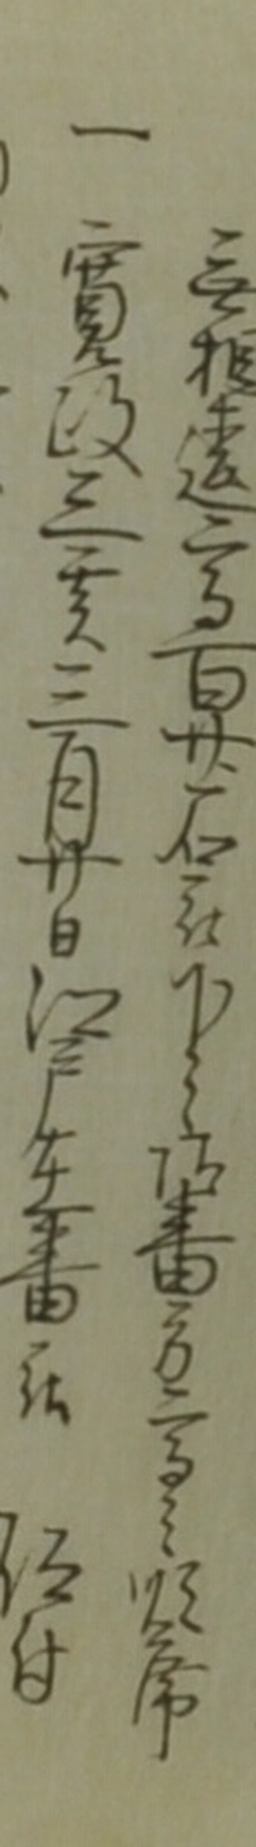一寛政三亥三月廿日江戸在番被仰付
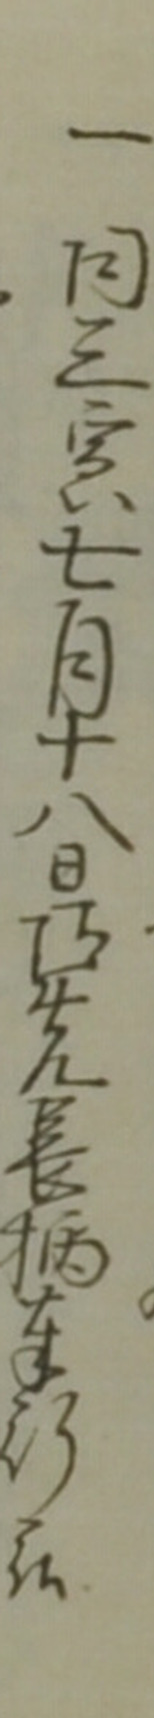一同三寅七月十八日御先長柄奉行被
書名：給人諸士勤仕録（三）
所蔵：伊那市立高遠町図書館・合同会社AMANE
